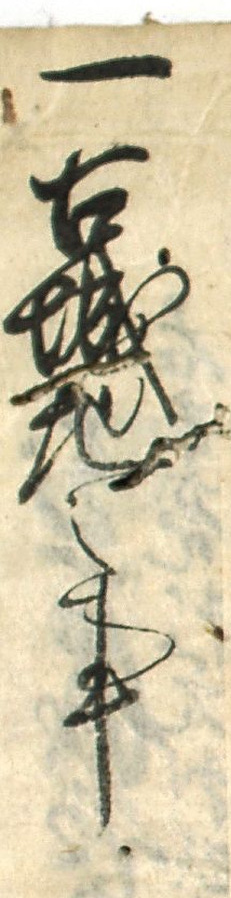一古城地之事
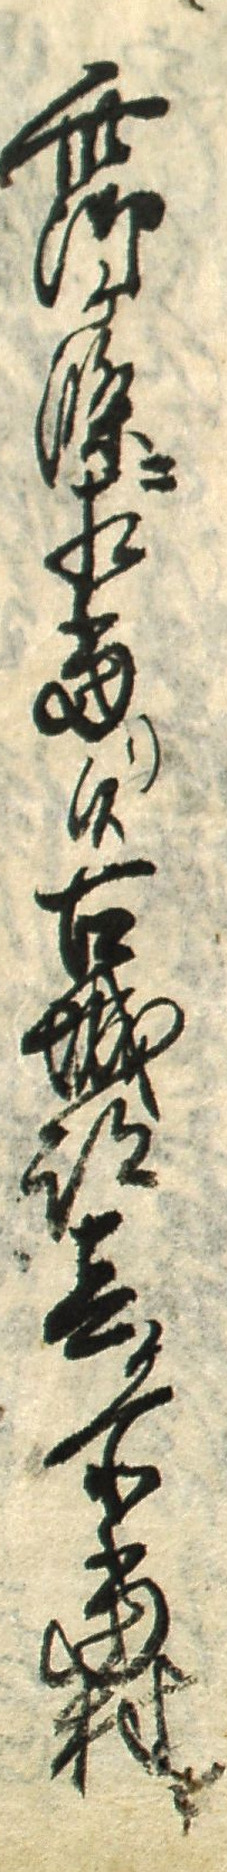此御ヶ條ニ相當り候古城跡壱ヶ所當村

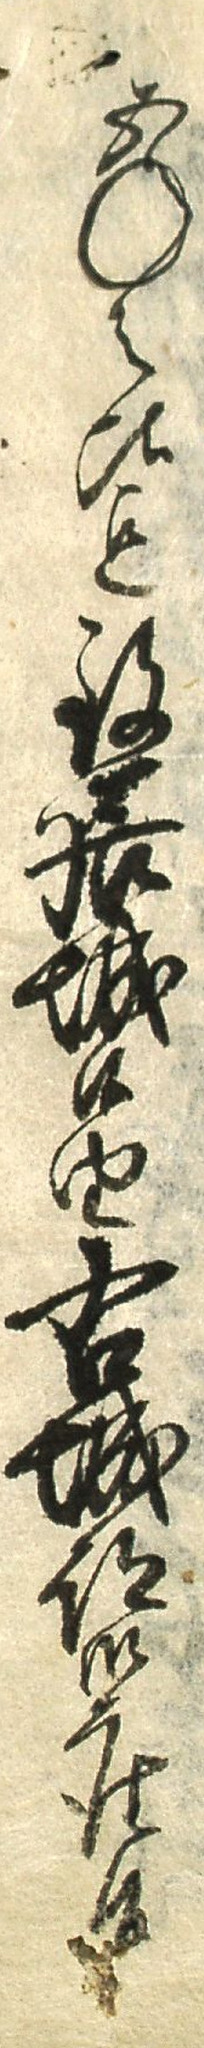五年之比迄致居城候由古城跡御座候
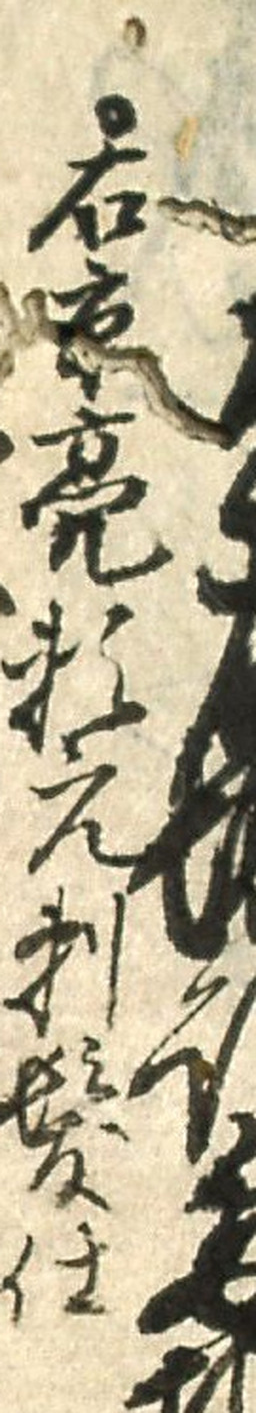○右京亮頼元剃髪仕
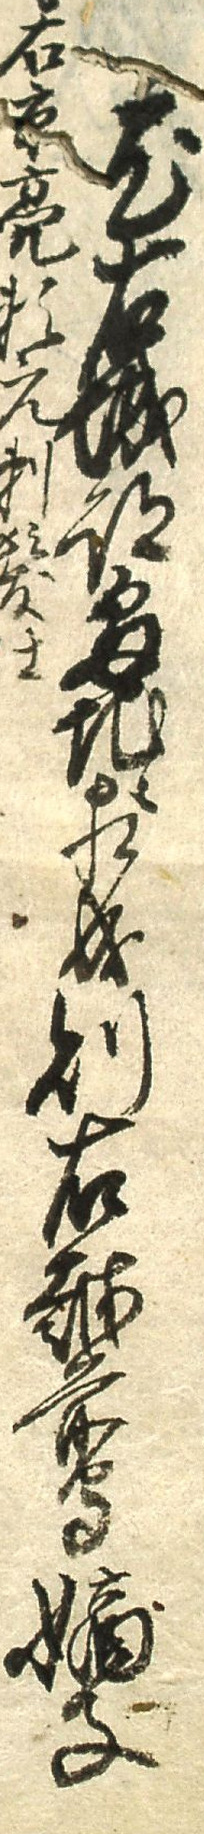尤右城跡畠地ニ相成則右越前守嫡子
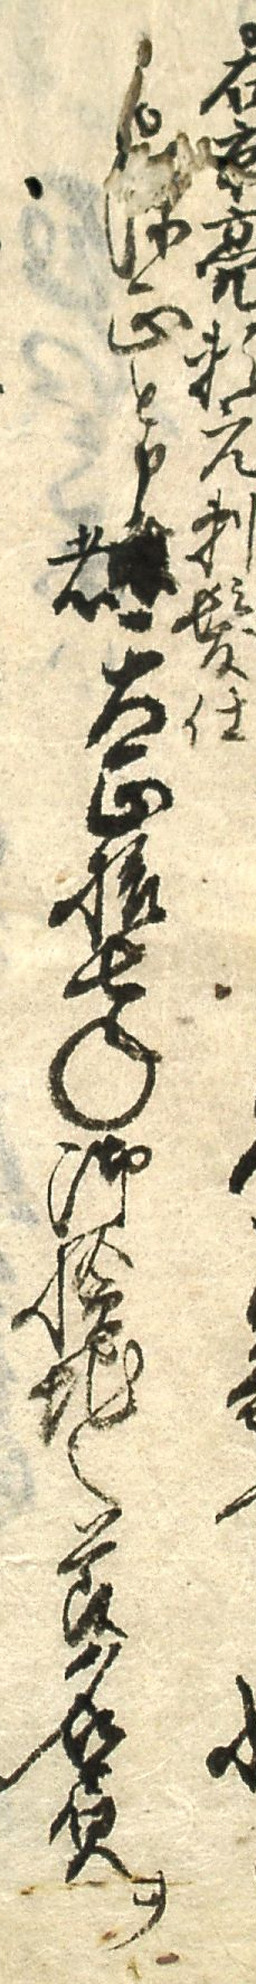○源正と申者天正拾七年御検地之節名負ヲ
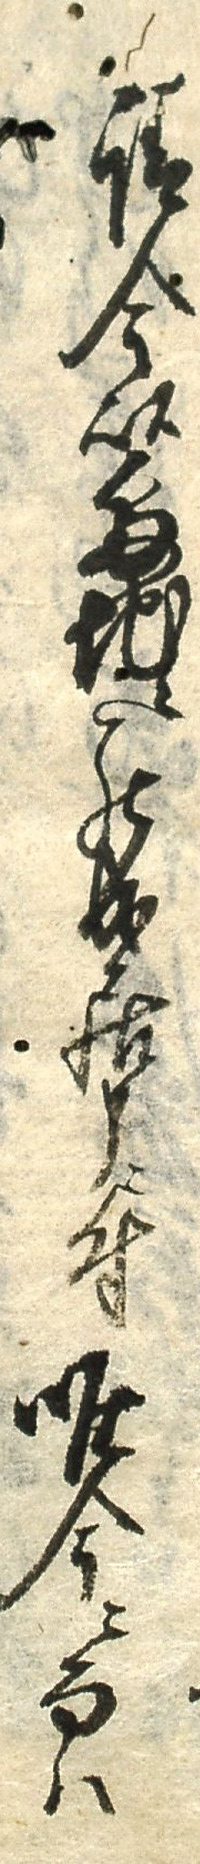請今以畠地ニ罷成居申ニ付唯今ニ而ハ
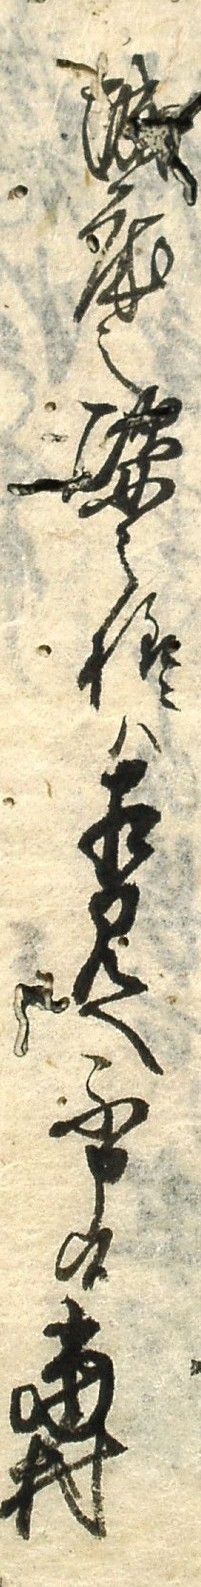城床之姿之様ニハ相見へ不申候當村
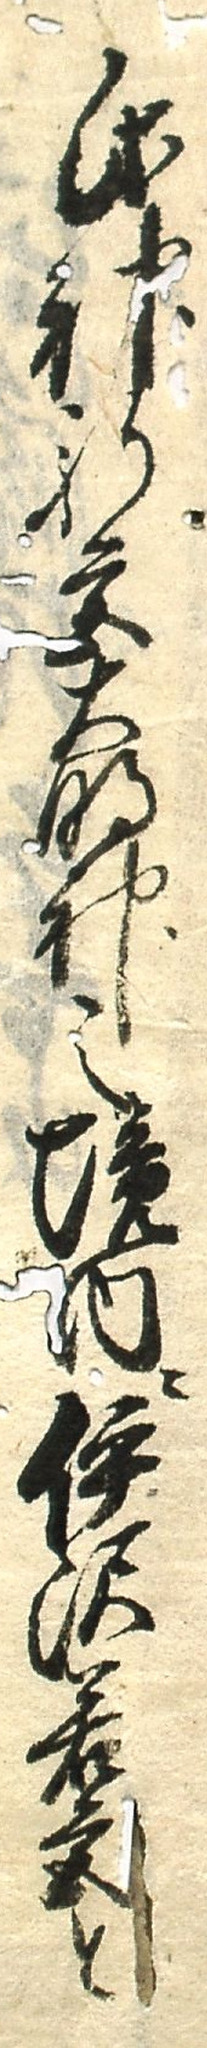氏神新宮大明神之境内ニ伊沢若宮と
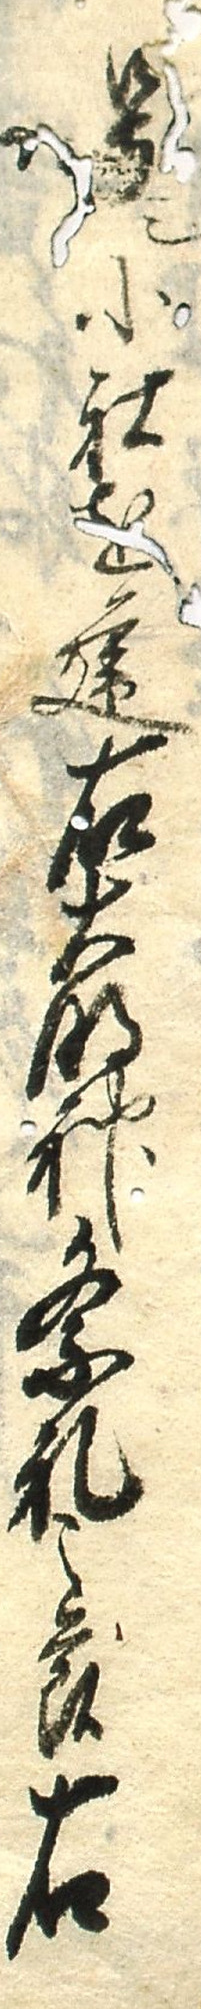号シ小社を建右大明神祭礼之節右
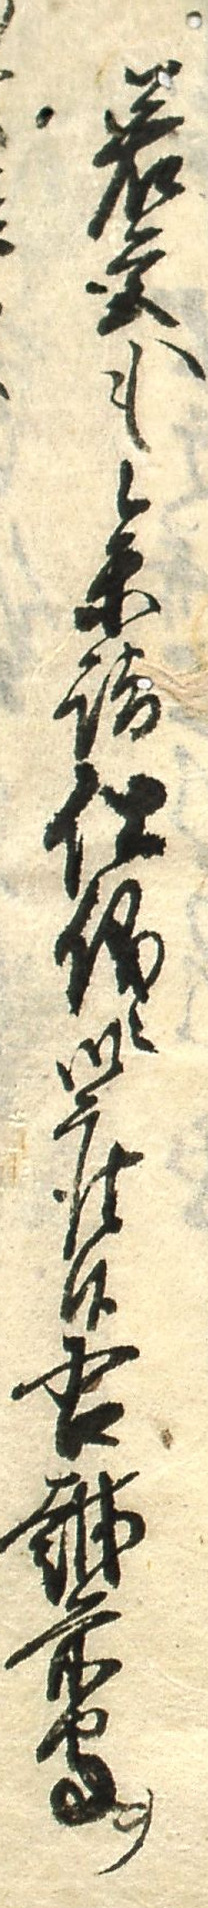若宮へも参詣仕儀ニ御座候右越前守ヲ
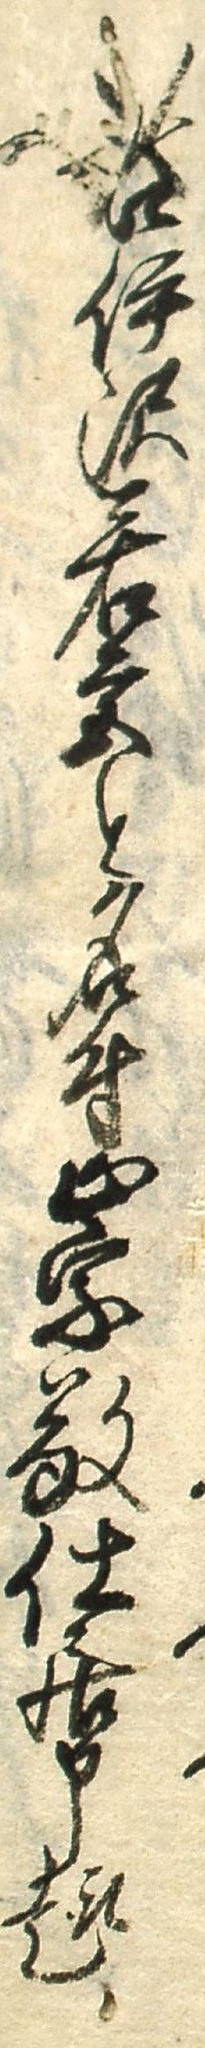伊沢若宮と名付崇敬仕居申趣
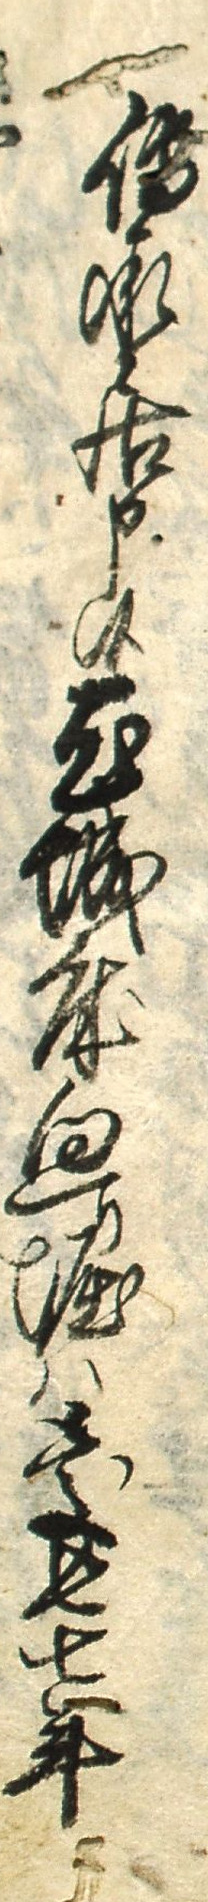傳承居申候尤城床廻り堀ハ慶長七年
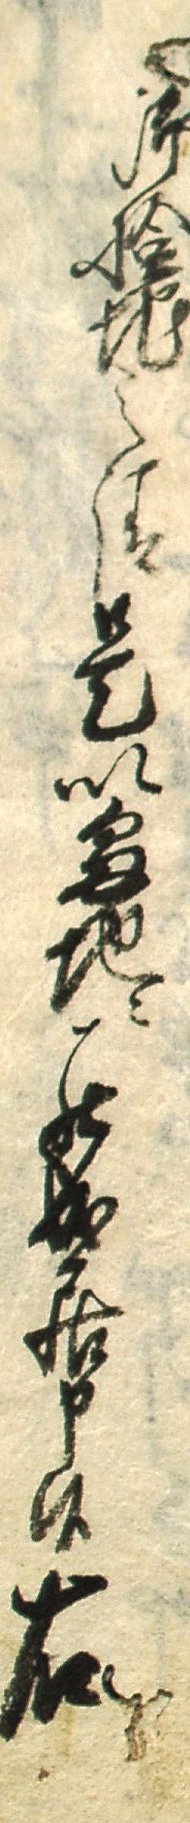御検地之請是以畠地ニ罷成居申候右
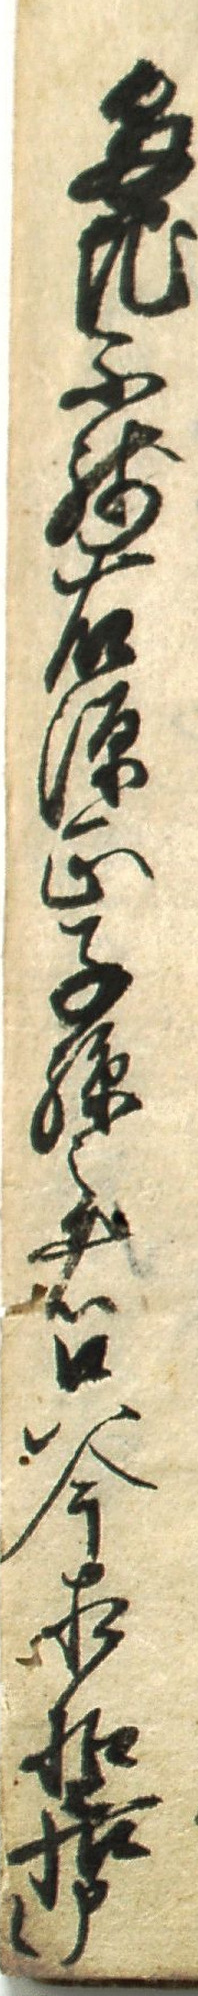畠地不残右源正子孫之者只今相扣居申候

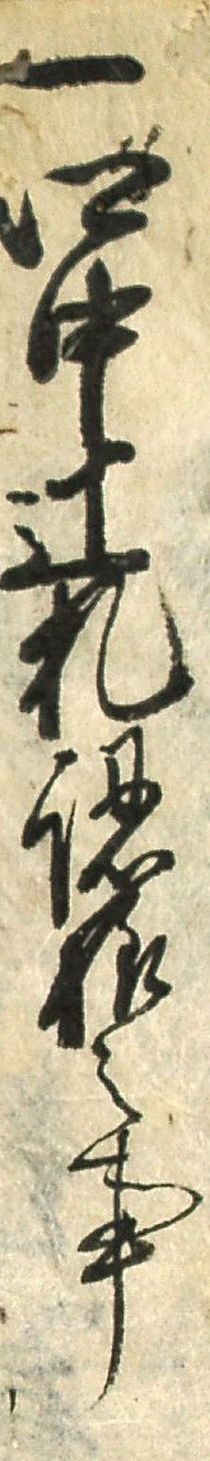一郷中辻札認様之事
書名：御ヶ条ヲ以被仰附株々申上帳（早渕村控）
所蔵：鳴門教育大学 Naruto University of Education
